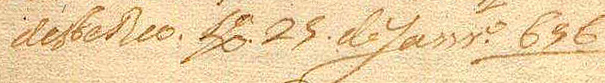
deste Reo. Lxa 25. de Janr.o 656
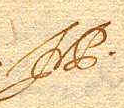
fr P.
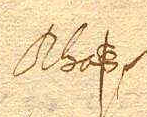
Rba
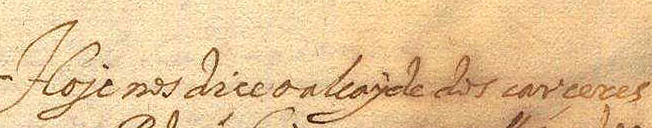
Hoje nos dice o alcayde dos carceres
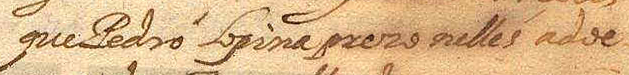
que Pedro Lopina prezo nelles adoe
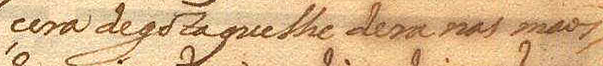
cera de gota que lhe dera nas maõs,
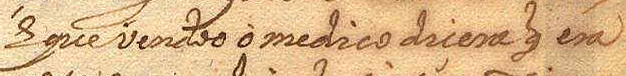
E que vendoo o medico dicera q̄ era
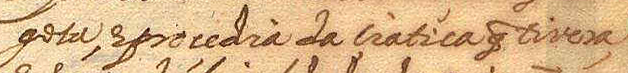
gota, E procedia da ciatica q̄ tivera,
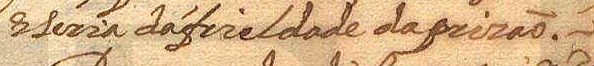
E seria da frieldade da prizaõ.
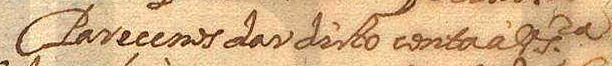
Parecenos dar disto conta a V s.ra
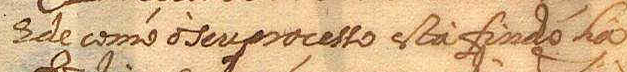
E de como o seu processo esta findo há
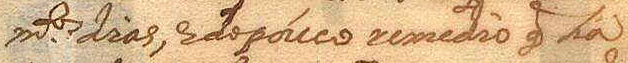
m.tos dias, E do pouco remedio q̄ há
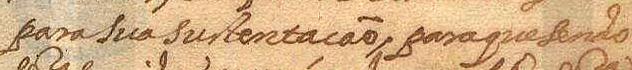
para sua sustentaçaõ, para que sendo
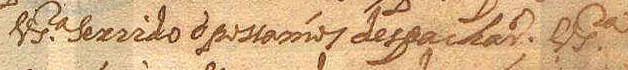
V s.ra servido o possamos despachar; V s.ra
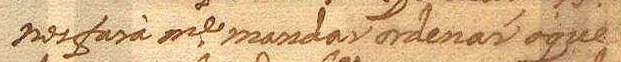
nos fara m.e mandar ordenar o que
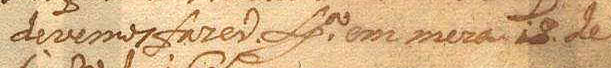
devemos fazer. Lx.a em meza i8 de
